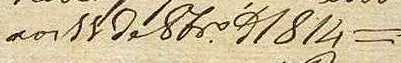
aos 11 de 8br.o d̄ 1814
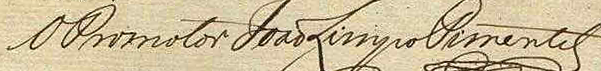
O Promotor Ioaõ Limpo Pimentel
